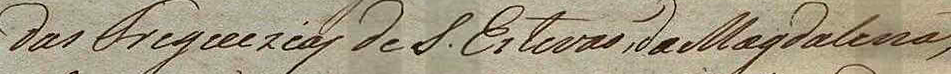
das Freguezias de S. Estevaõ, da Magdalena,
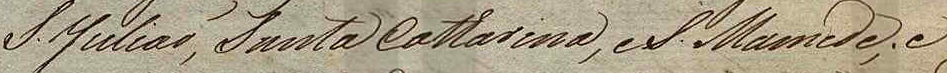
S. Juliaõ, Santa Catharina, e S. Mamede, e
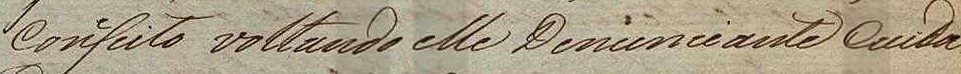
Conefeito voltando elle Denunciante cuida
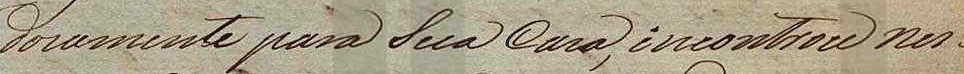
dozamente para Sua caza, incontrou nes
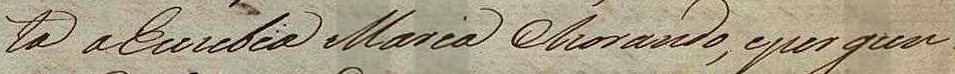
ta a Euzebia Maria chorando, e pergun
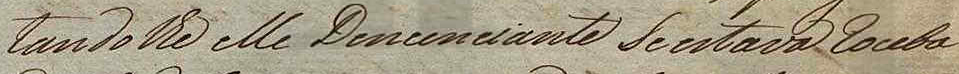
tandolhe elle Denunciante se estava Rouba
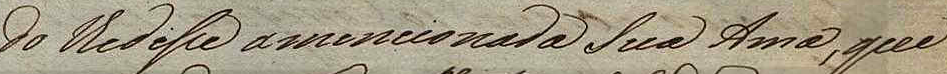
do lhe disse a mencionada Sua Ama, que
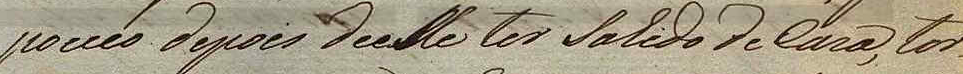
pouco depois de elle ter Sahido de caza, tor
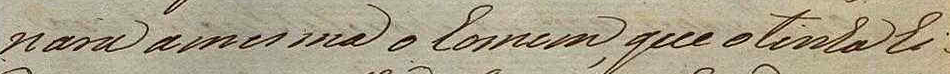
nara a mesma o homem, que o tinha hi
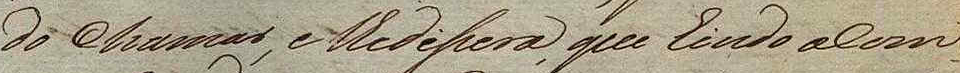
do chamar, e lhe dissera, que hindo acom
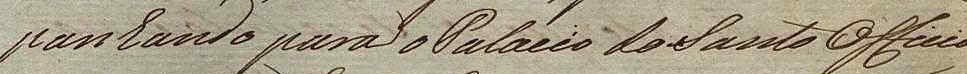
panhando para o Palacio do Santo Officio,
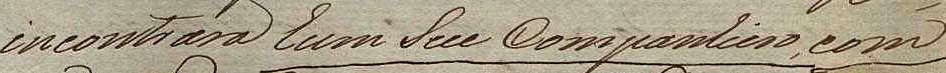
incontrara hum Seu Companheiro, com
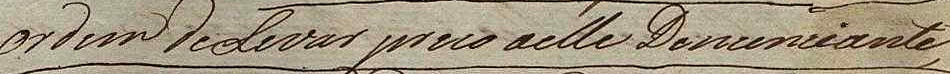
ordem de Levar prezo a elle Denunciante,
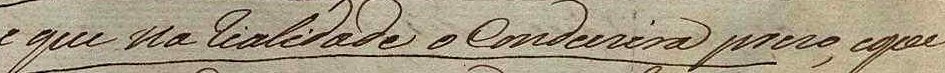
e que na Rialidade o conduzira prezo, e que
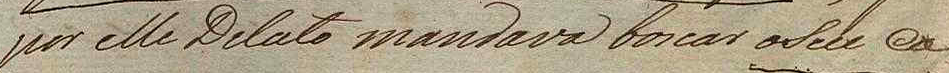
por elle Delato mandava boscar o seu ca
